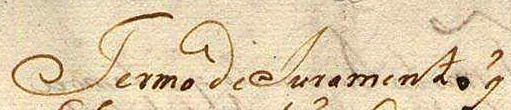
Termo de Iuramento q̄
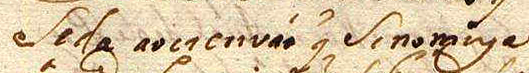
Se da ao escrivaõ q̄ Se nomeya
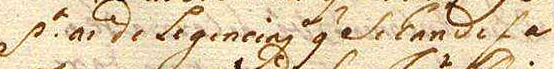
p.a as deligencias q̄ Se han de fa
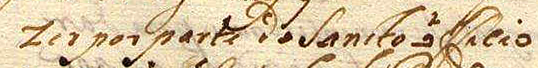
zer por parte do Sancto officio
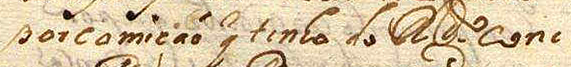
por comiçaõ q̄ tenho do Rd.o cone
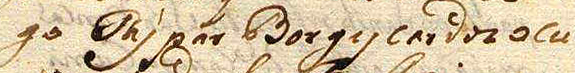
go Gaspar Borges cardozo cu
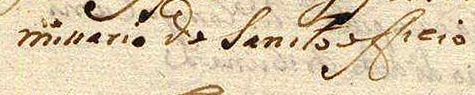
missario do Sancto officio
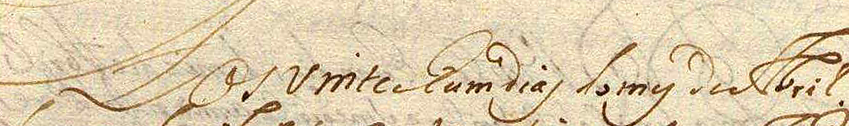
Aos vinte e hum dias do mes de Abril
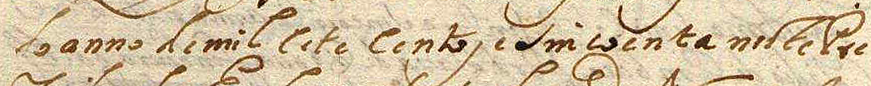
do anno de mil setecentos e sincoenta neste Pre
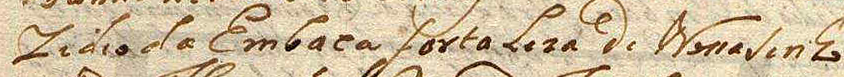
Zidio da Embaca fortaLeza de Nossa Senho
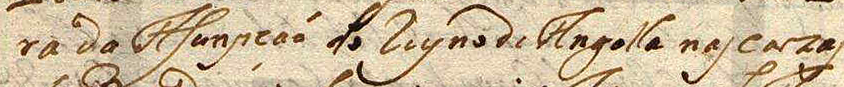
ra da Asunpçaõ do Reyno de Angolla nas cazas
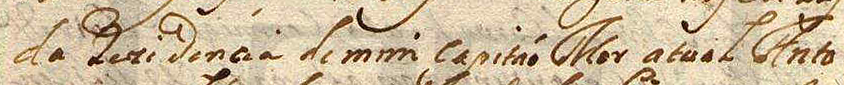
da Rezidencia de mim capitaõ Mor atual Anto
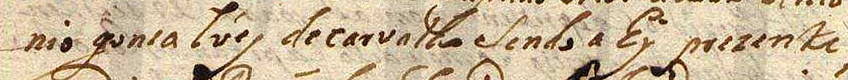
nio gonsalves de carvalho Sendo ahy prezente
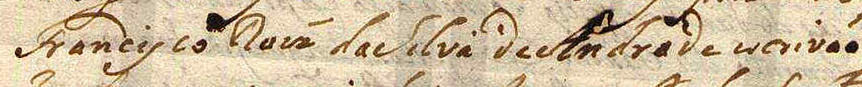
Francisco Roiz̄ da Silva de Andrade escrivaõ
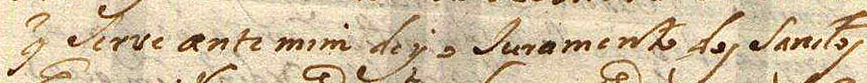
q̄ serve ante mim dey o Iuramento dos Sanctos
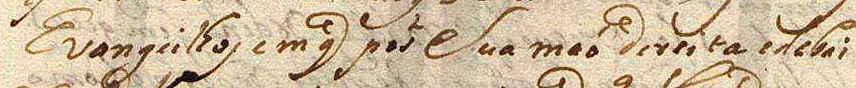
Evangeilhos em q̄ pos Sua maõ direita e debai
